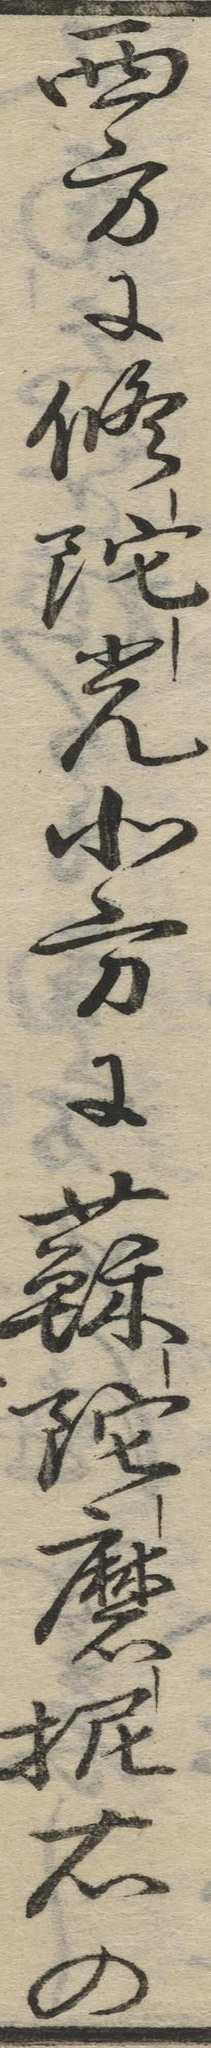西方に修陀光北方に蘇陀磨抳右の
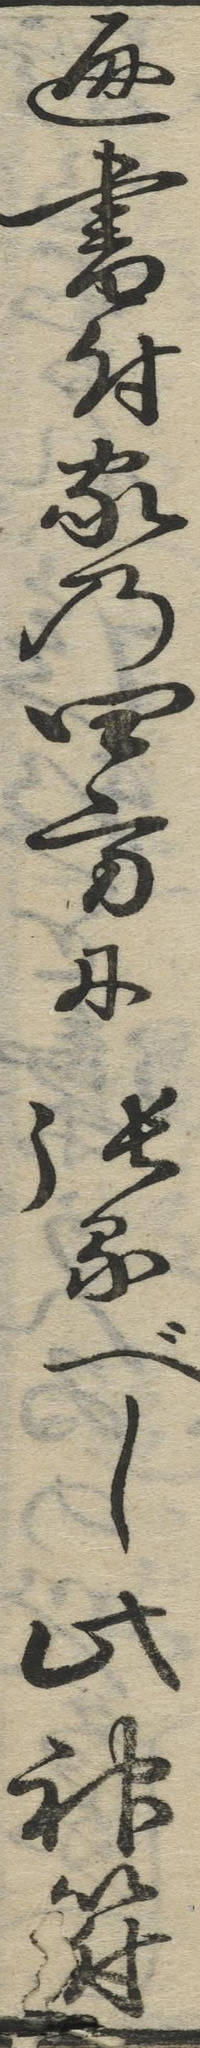通書付家の四方に張るべし此神符
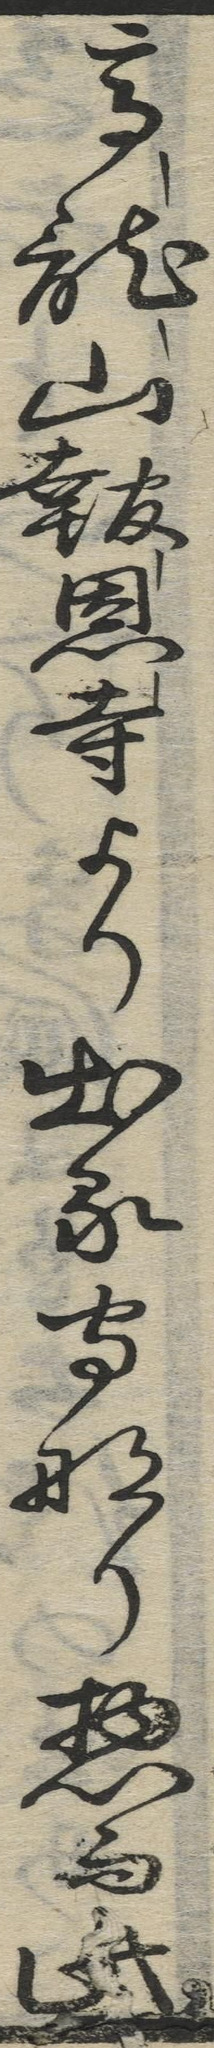高龍山報恩寺より出家守なり惣而此
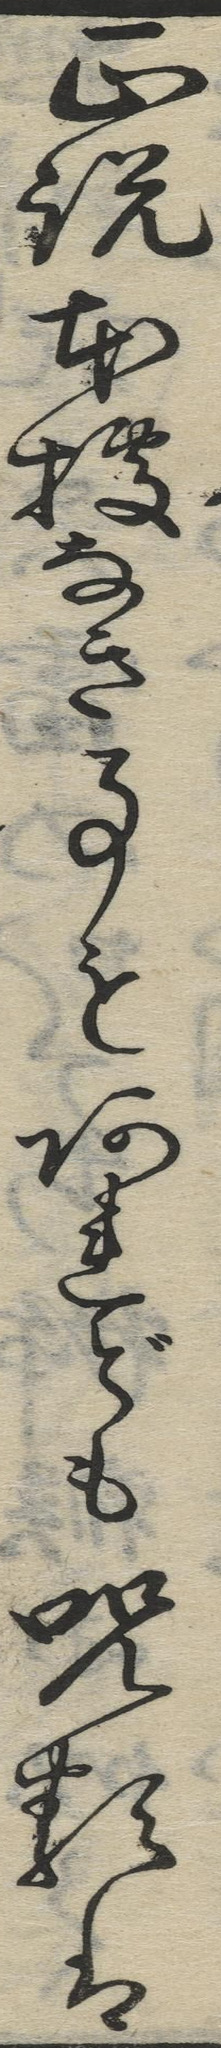正統本授なき事をあれども呪るは
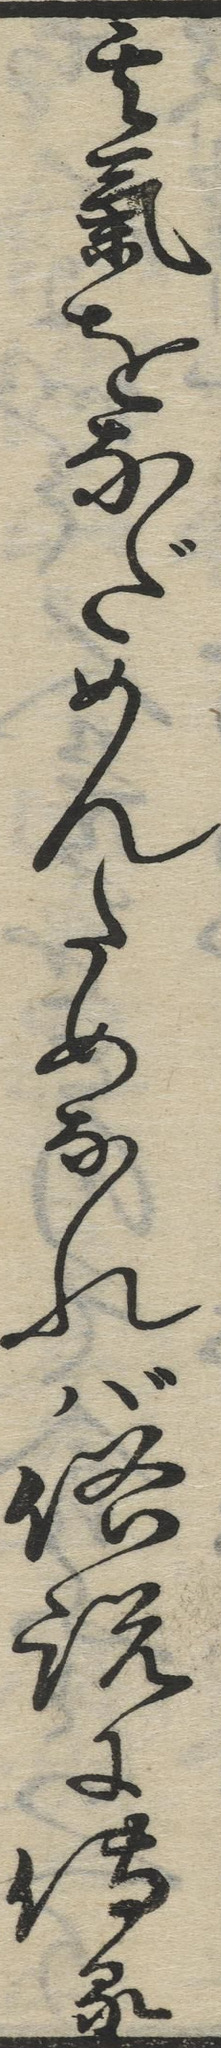其気をなだめんためなれバ俗説に傳る
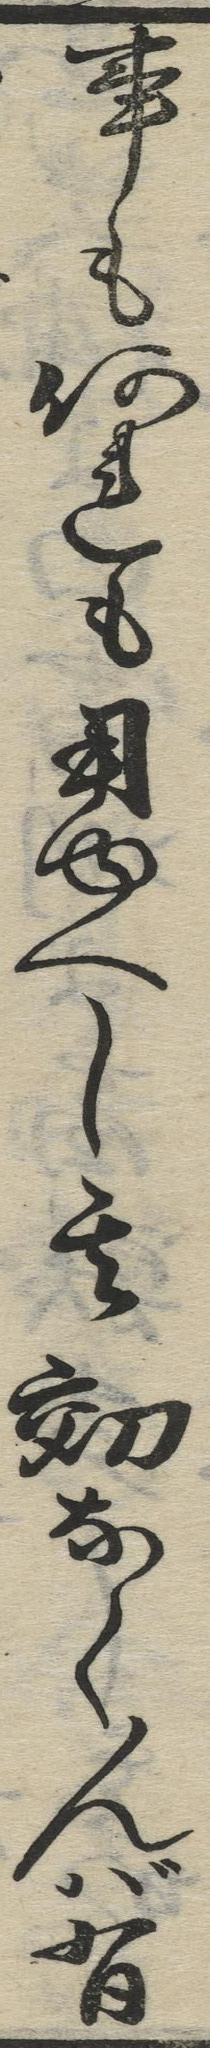事もあれも用ゆへし其効なくんバ有
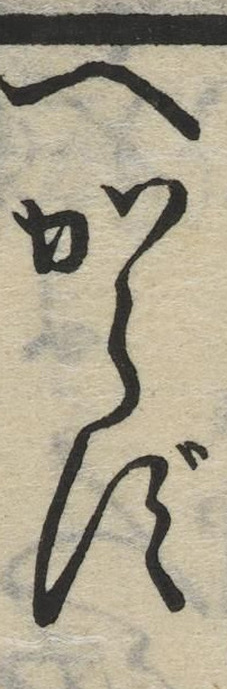へからず
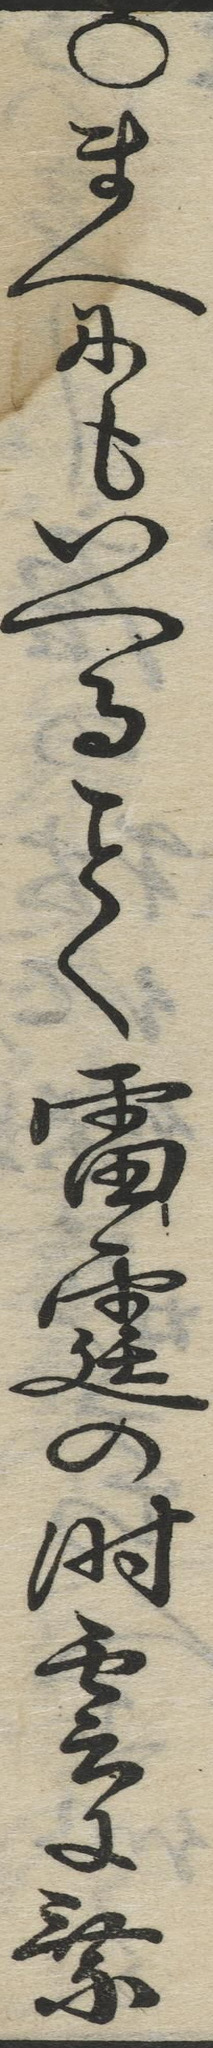〇まへにもいへることく雷霆の時雲に乗
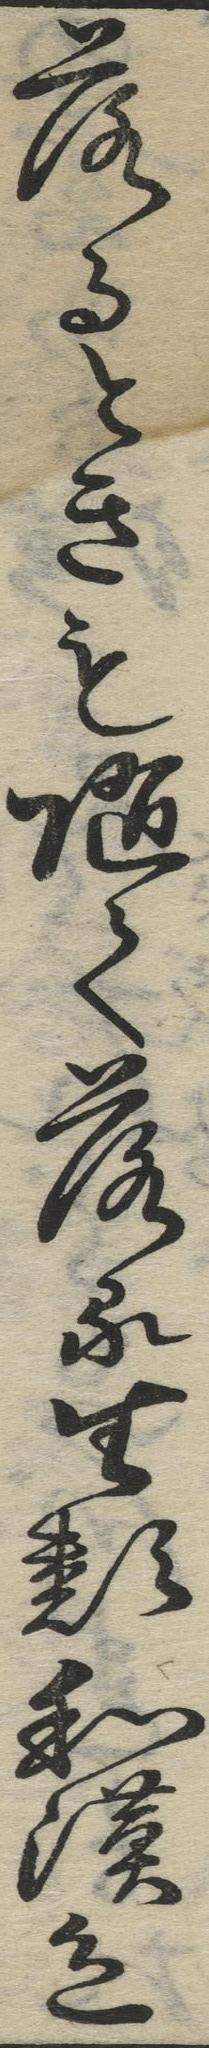落るときも隔て落る生類和漢色
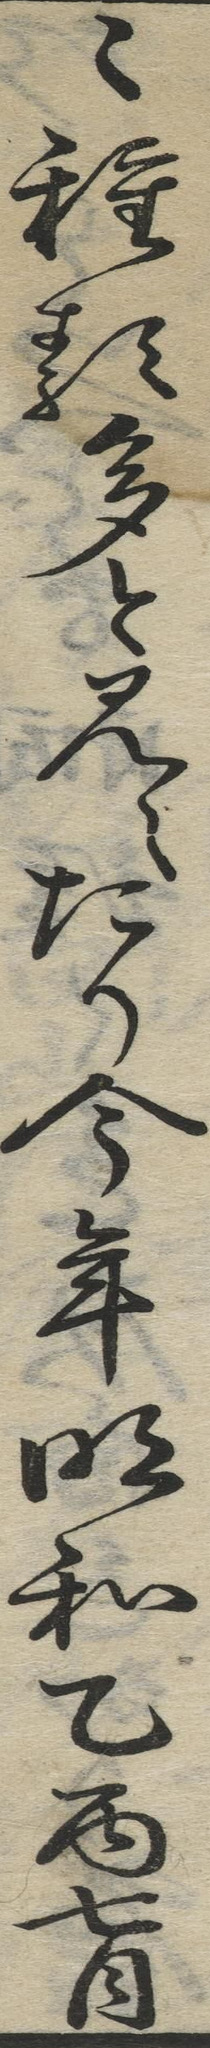々種類多と見へたり今年明和乙酉七月
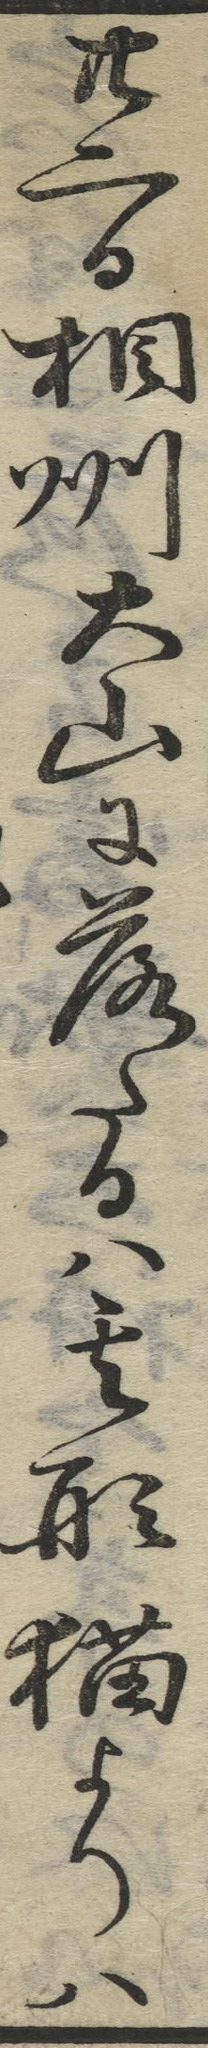廿二日相州大山に落たるハ其形猫よりハ
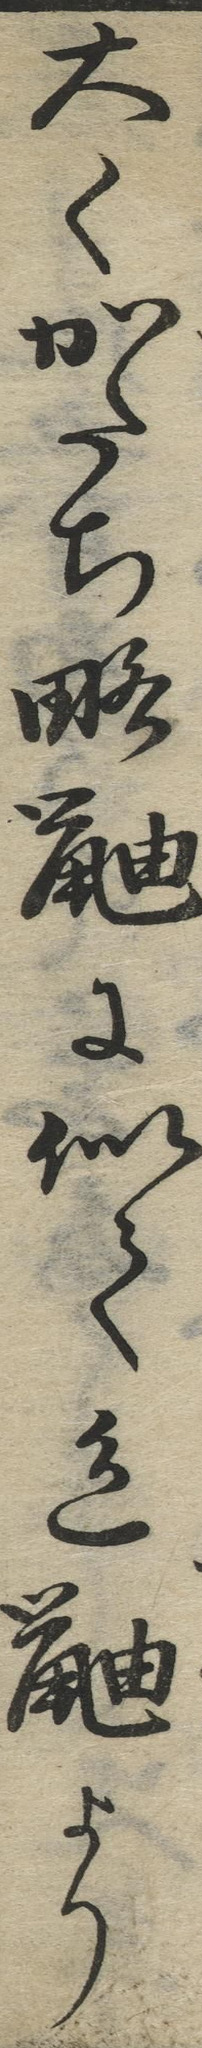大くかたち略鼬に似て色鼬より

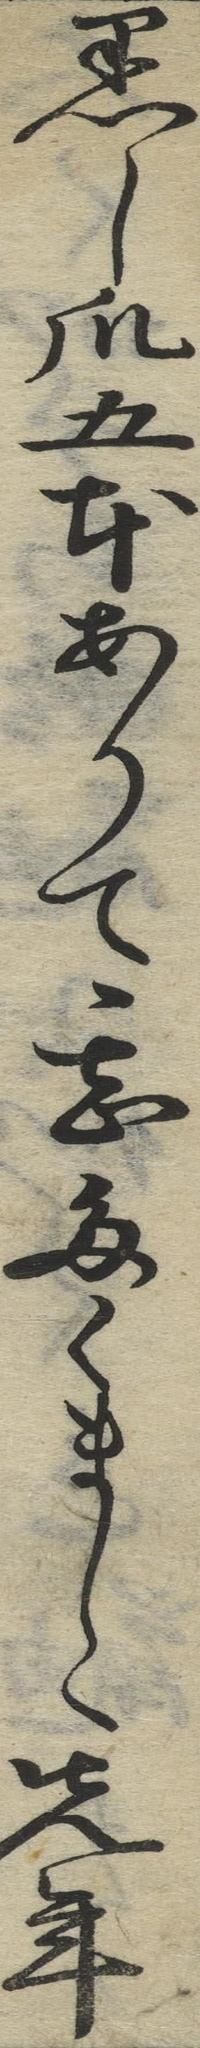黒し爪五本ありて甚たくましく先年
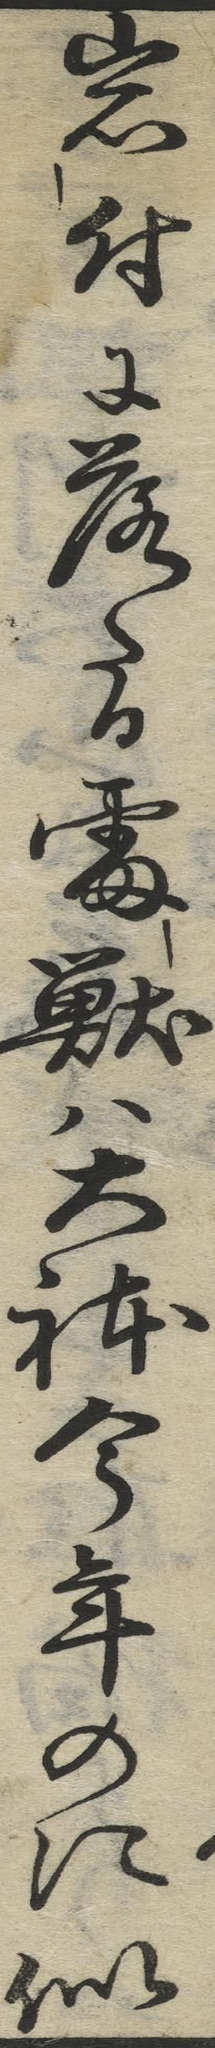岩付に落たる雷獣ハ大躰今年のに似
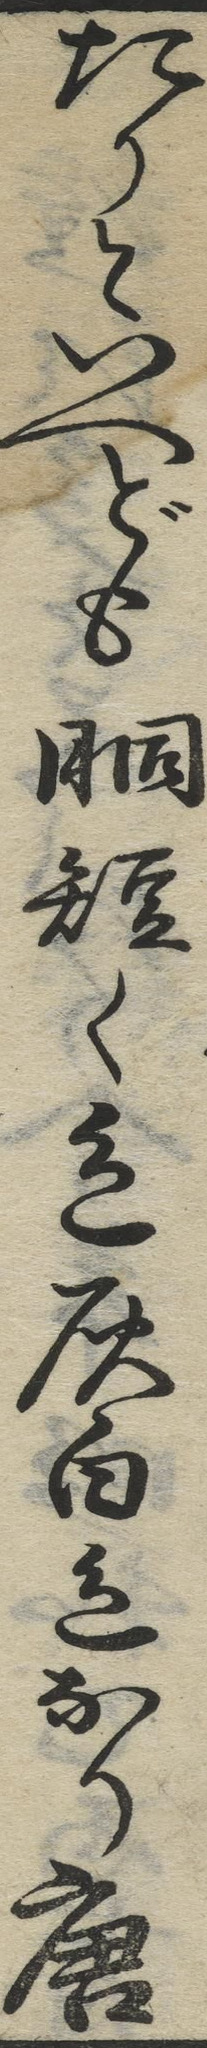たりといへども胴短く色灰白色なり唐
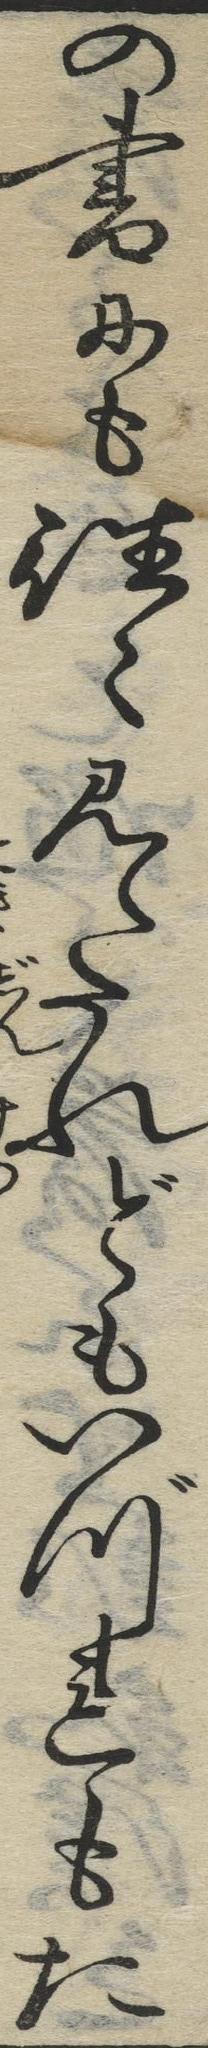の書にも往々見たれどもいづれともた
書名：雷震記　完
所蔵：東京大学地震研究所図書室 Earthquake Research Institute Library, The University of Tokyo, JAPAN
